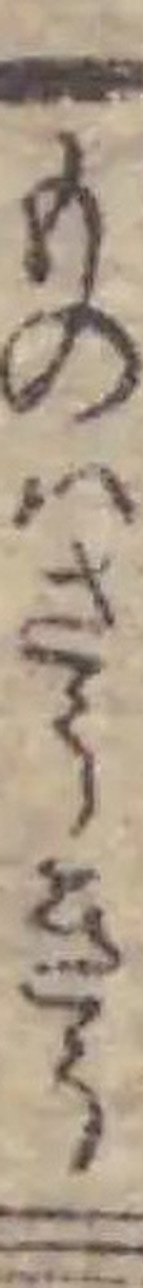ものはさうきう
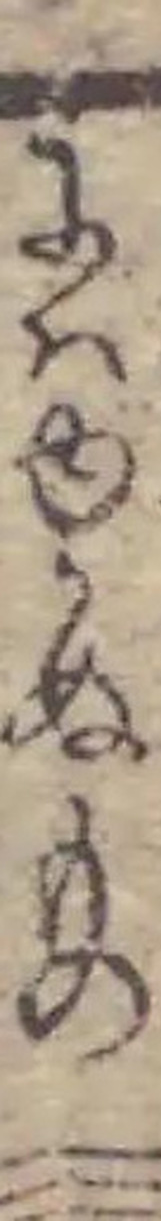にはゆかぬもの
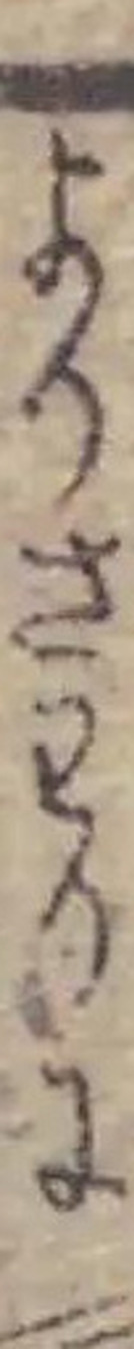よりさわりに
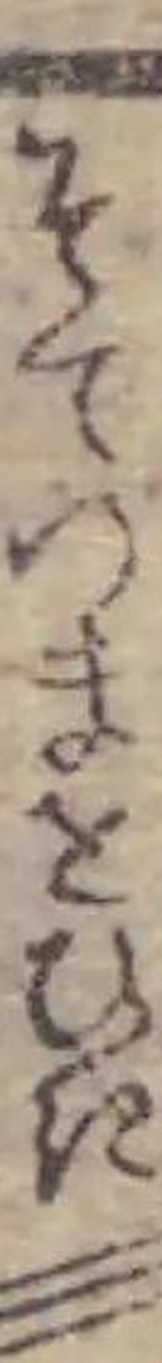そてつまをひき
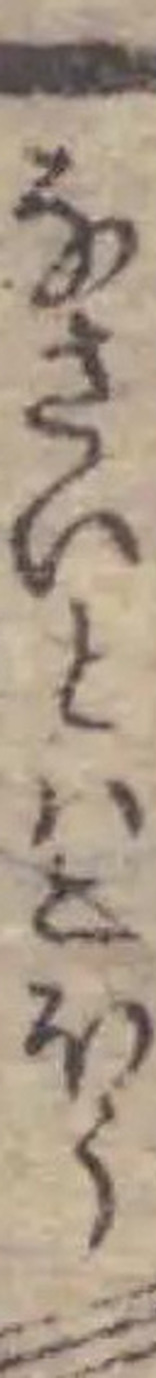なさいとはこほう
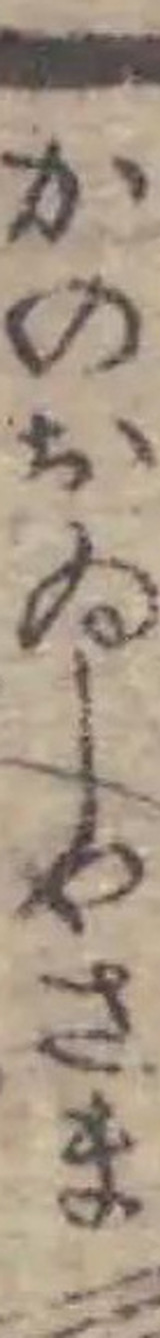かのおゐしやさま
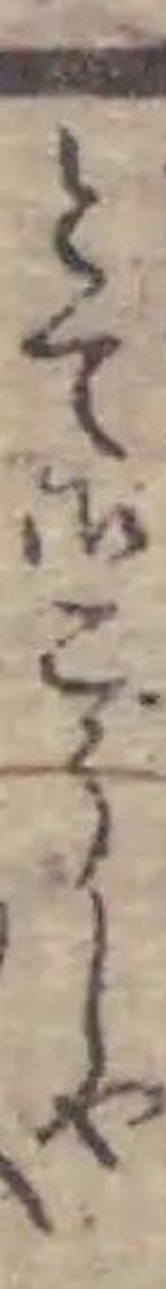とて御こうしや
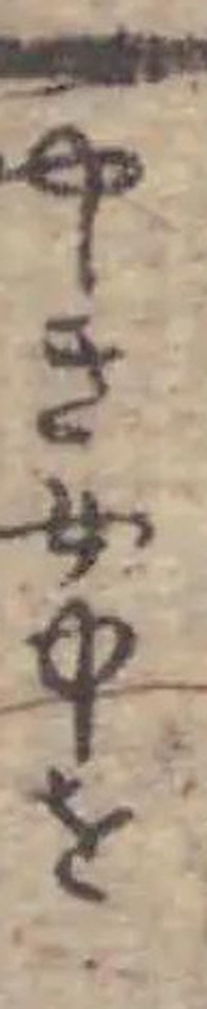やしき女中を
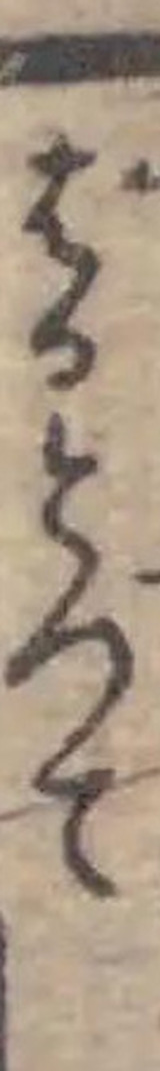はるとつて
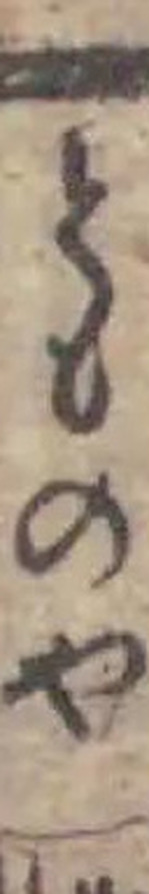とものや
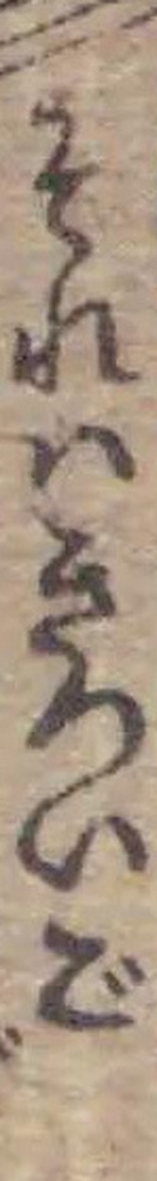それはきついご
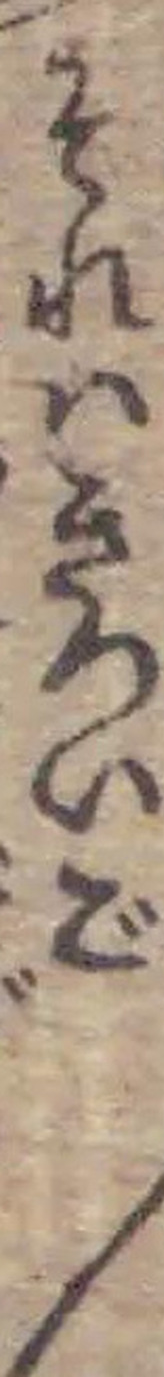それはきついご
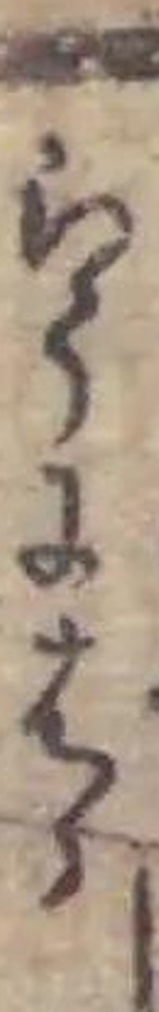らうにはら
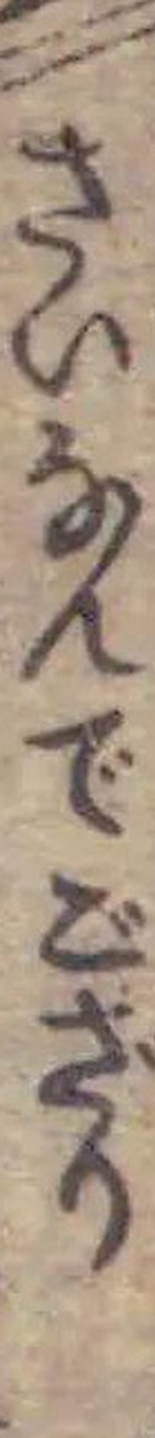さいなんでござり
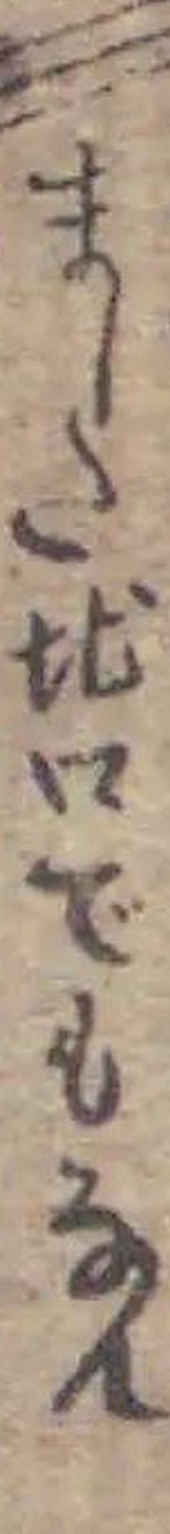ました地口でもなん
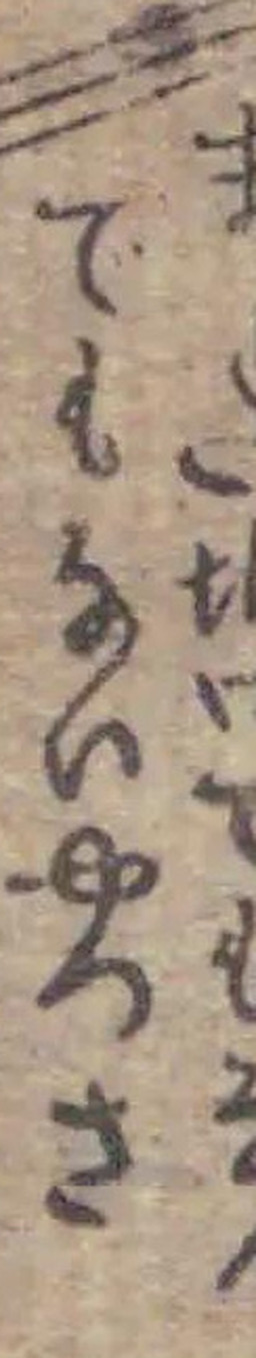でもないやつさ
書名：色男其処此処 3巻
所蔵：国立国会図書館 National Diet Library, JAPAN
